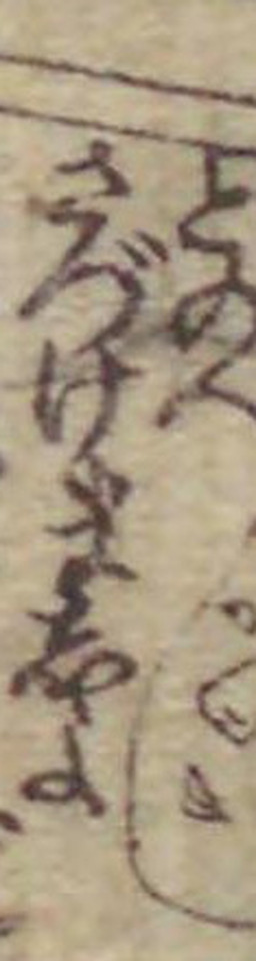さづけましよ
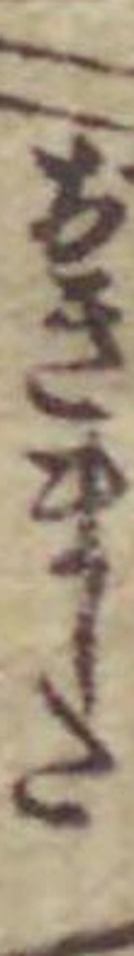おきました
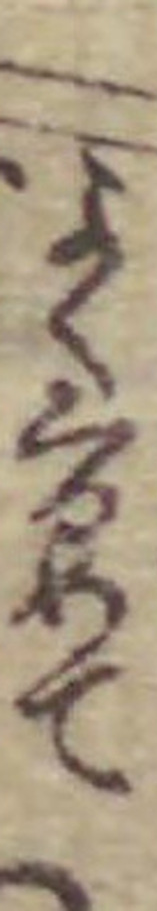よくくるめて
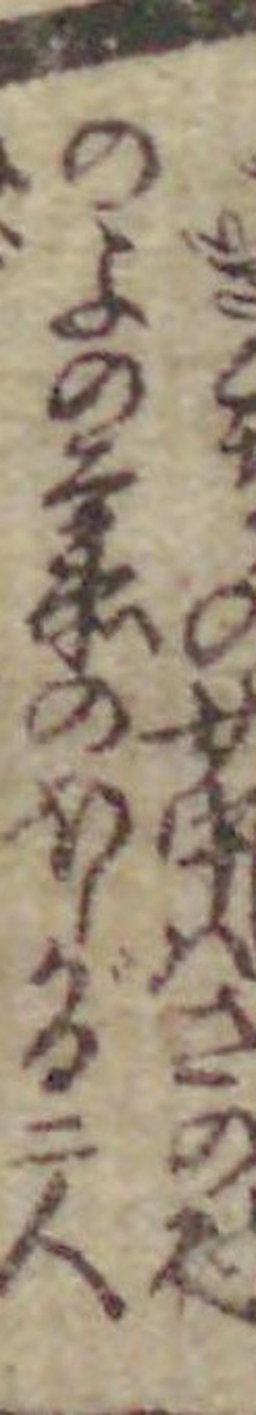のよの兵衛のほしがる二人
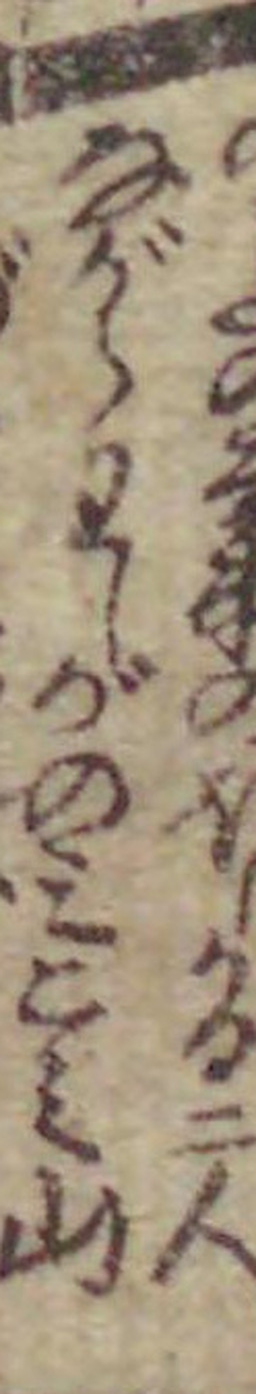ながらわしがのみこみ山
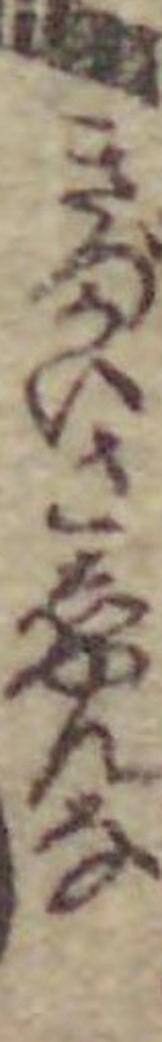きづかいさしやんな
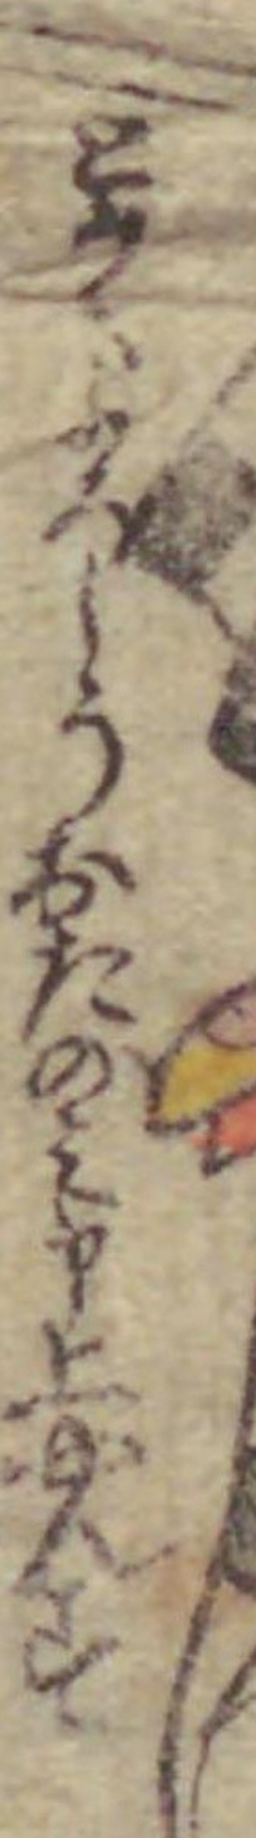とかくよろしうおたのみ申上やんす
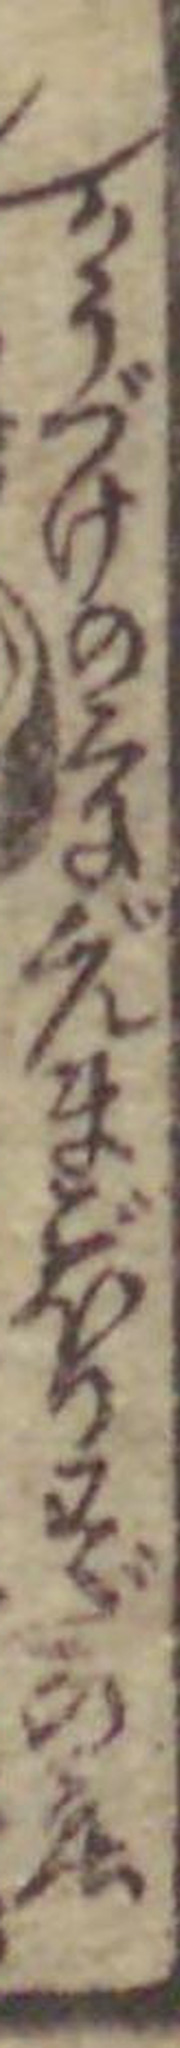かうづけのくにぐんまごほりわだの庄
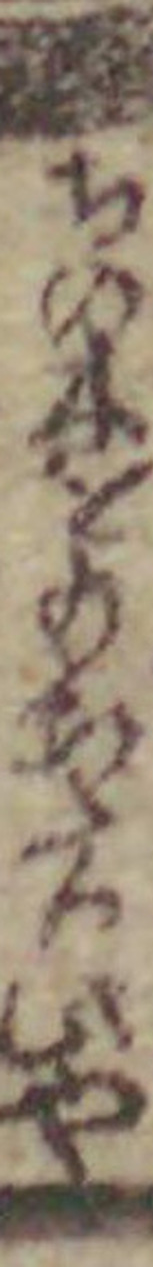はちの木をもちたる此や
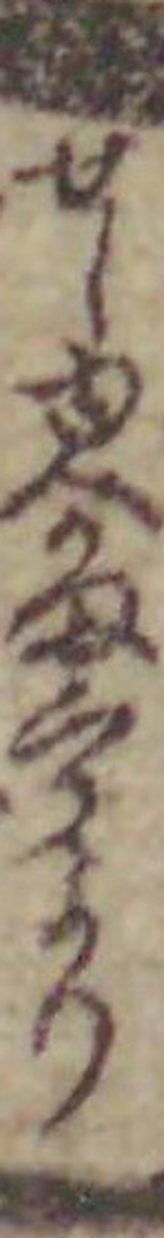ませしゆへかまくらより
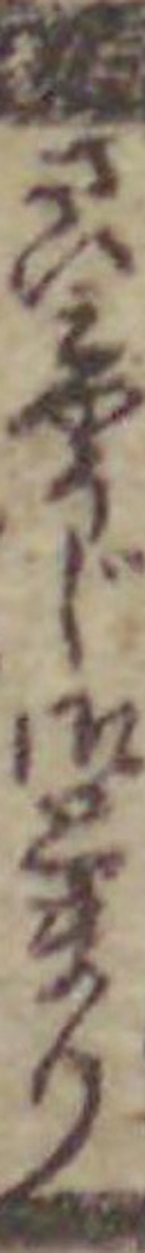にさいみやうじ御とまり
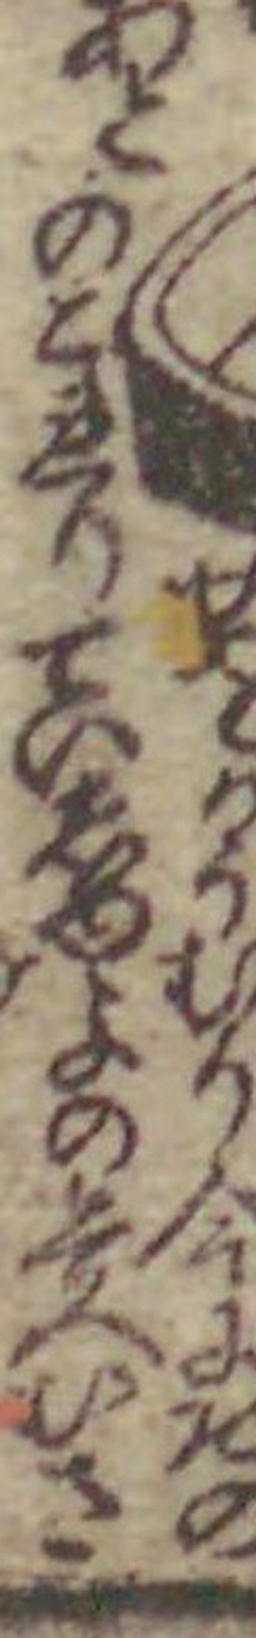あとのこれりていしゆよの兵へむさ
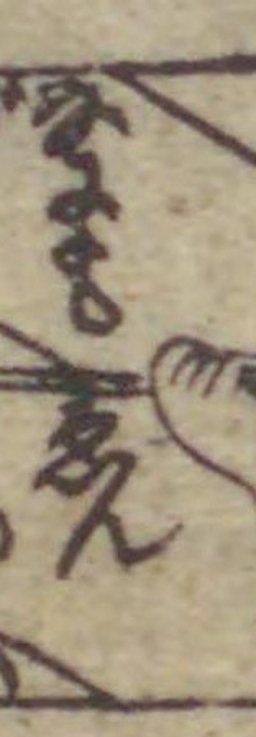なにもゑん
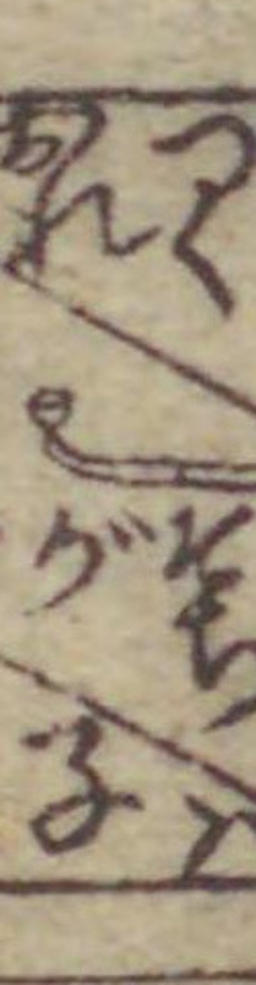おれが子
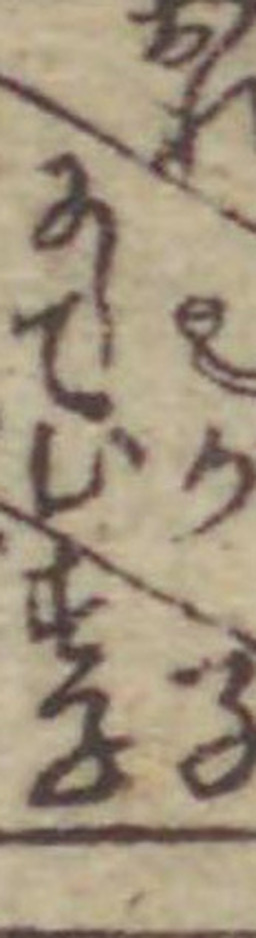にしてむす子
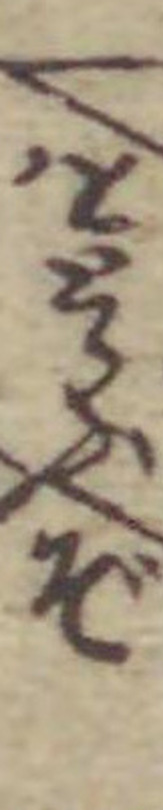をとらふぞ
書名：娜二代鉢木 5巻
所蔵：国立国会図書館 National Diet Library, JAPAN
